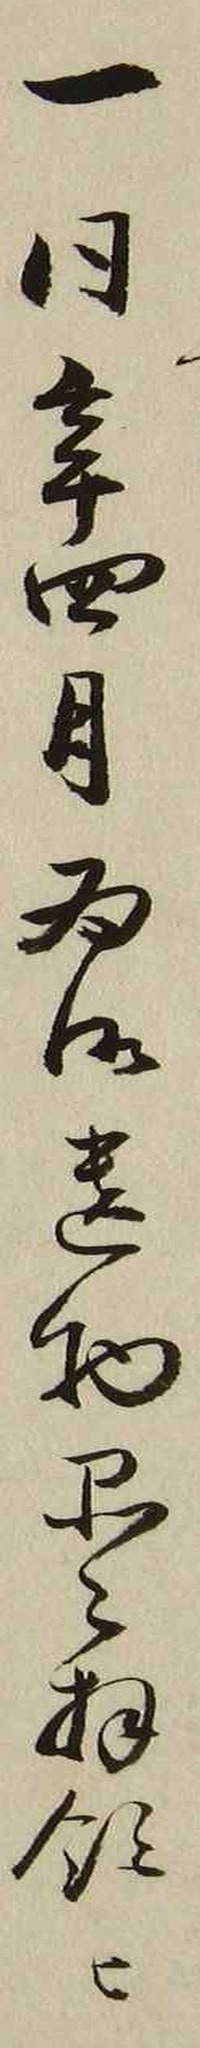一同年四月為御遺物品々拝領被
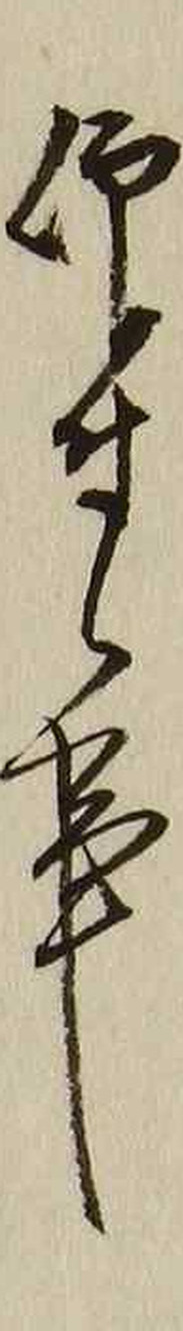仰付候事
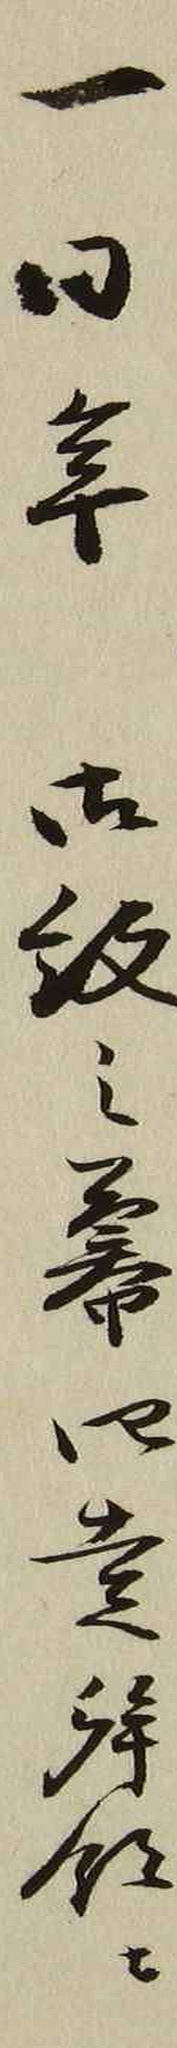一同年御紋之幕四遠拝領被
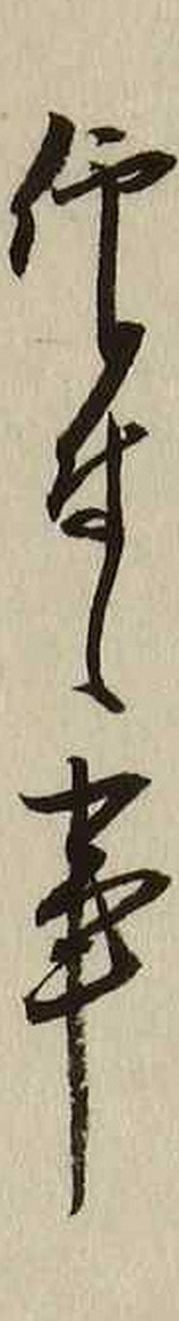仰付候事
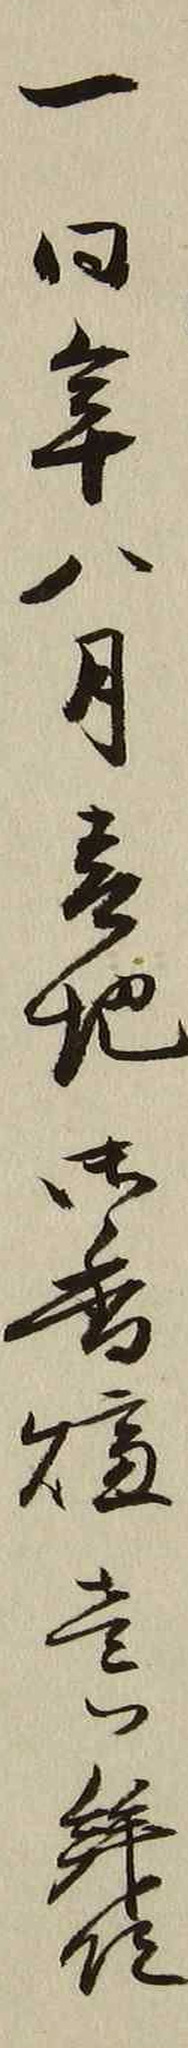一同年八月青地御香炉壱ツ拝領
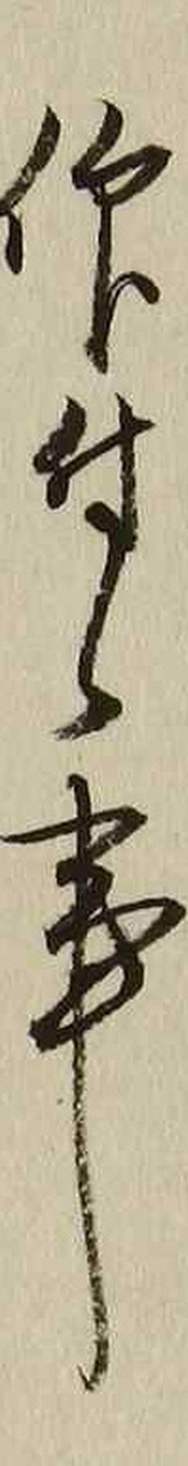仰付候事
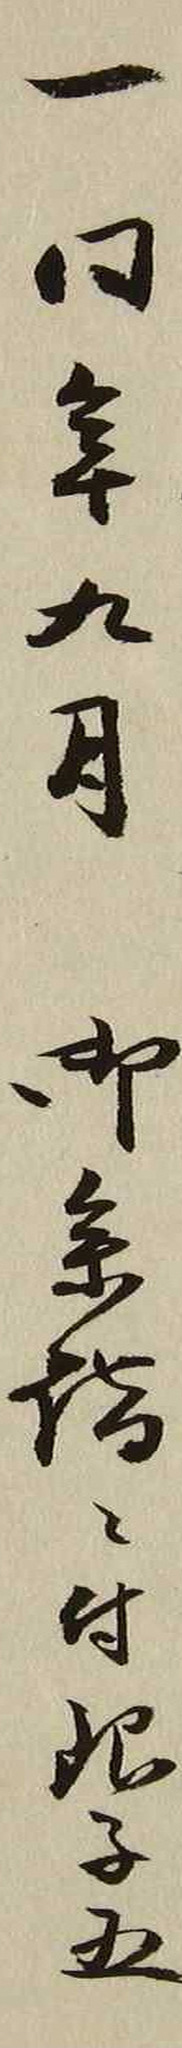一同年九月御参詣ニ付銀子五
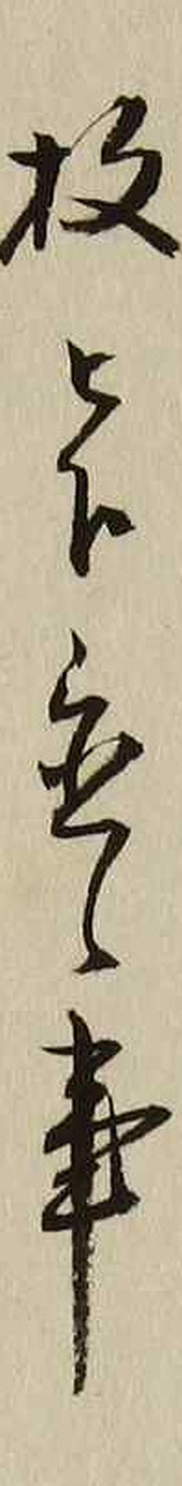枚被下置候事
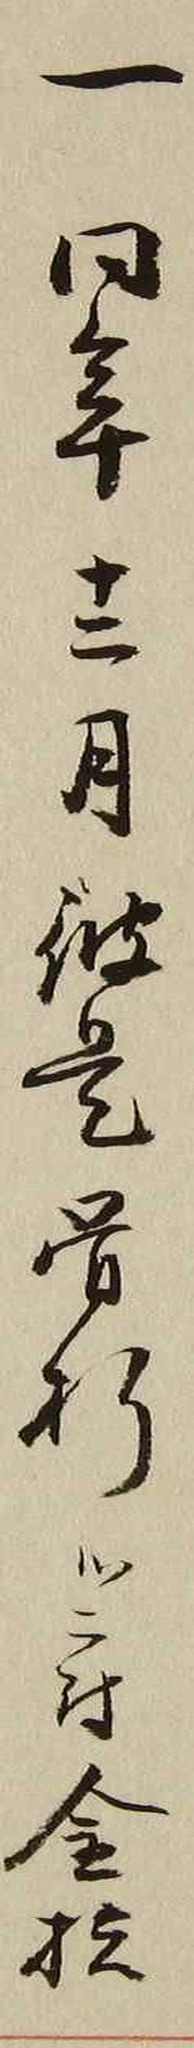一同年十二月彼是骨折候ニ付金拾
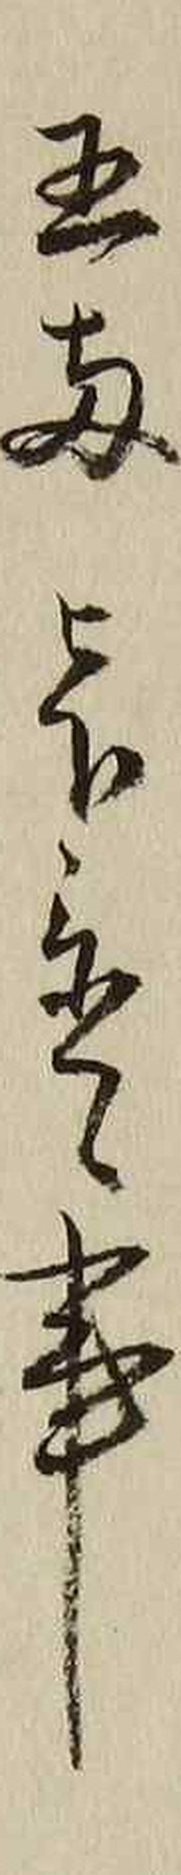五両被下置候事
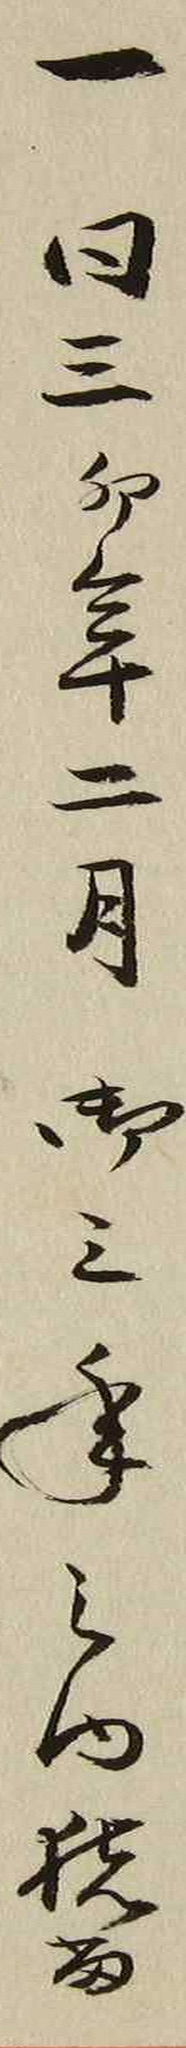一同三卯年二月御三年之内猪苗
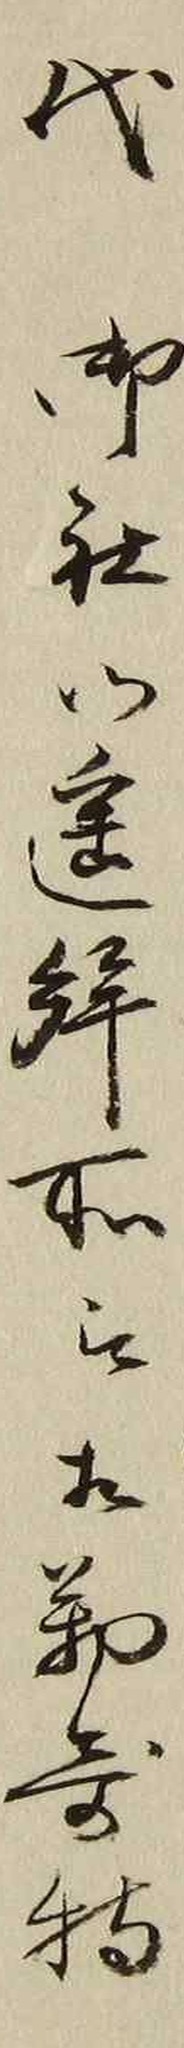代御社御遙拝所江相勤奇特
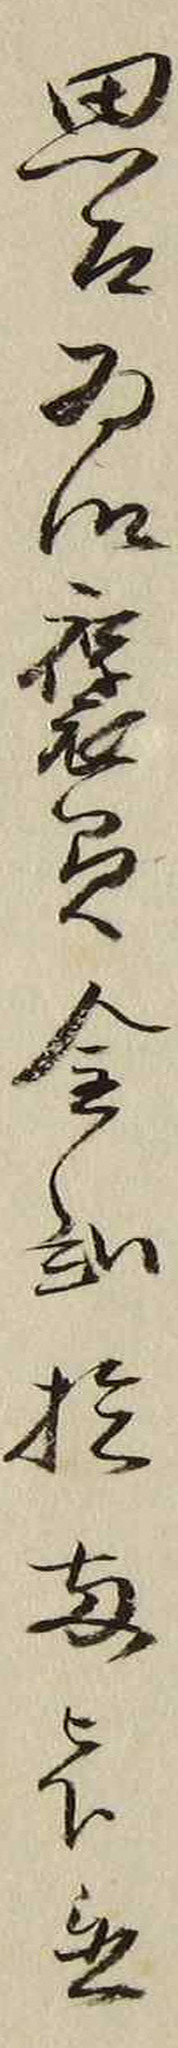思召為御褒美金弐拾両被下置
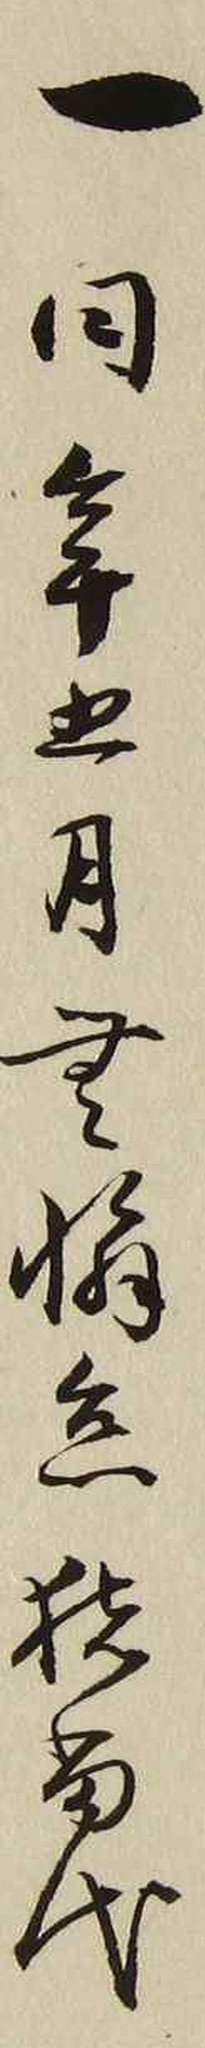一同年五月無懈怠猪苗代
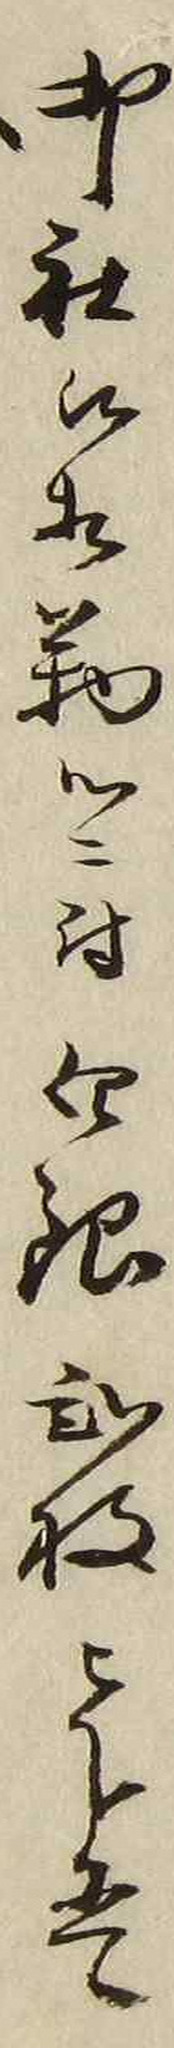御社江相勤候ニ付白銀弐枚被下置候

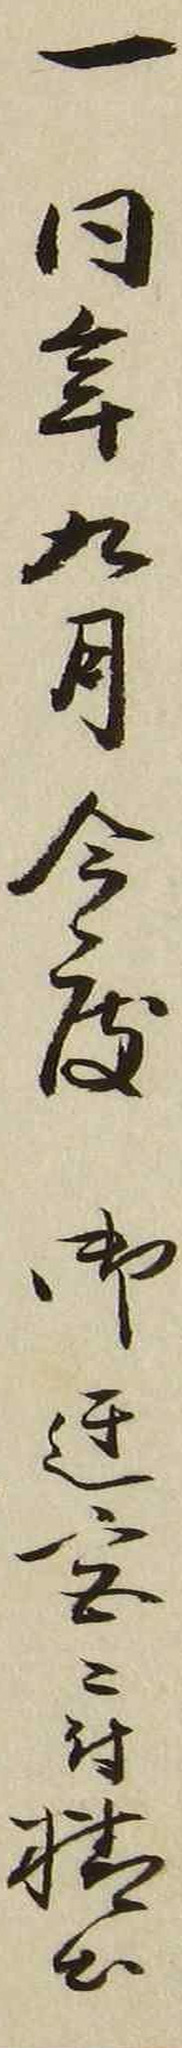一同年九月今度御遷宮ニ付精出
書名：諸士系譜　巻之291　さ之部23
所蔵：会津若松市立会津図書館
